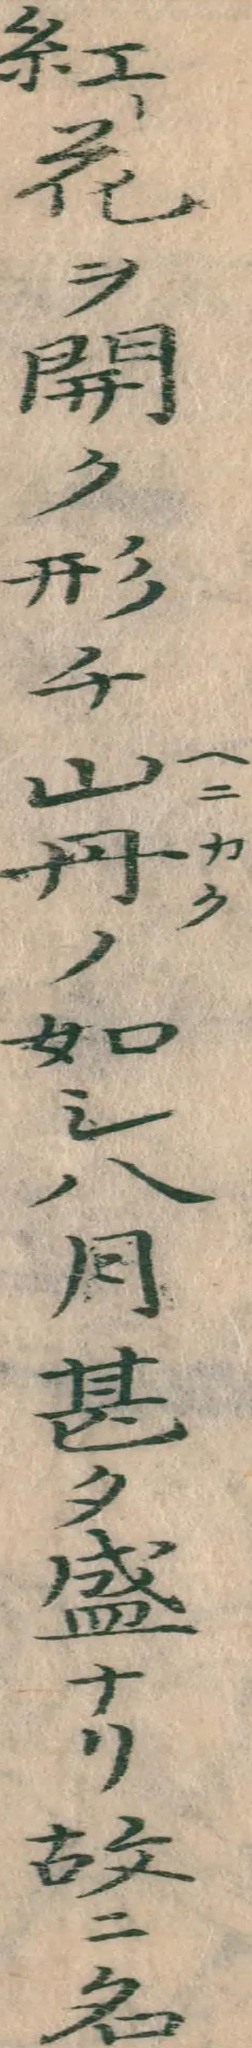紅-花ヲ開ク形チ山丹ノ如シ八月甚タ盛ナリ故ニ名
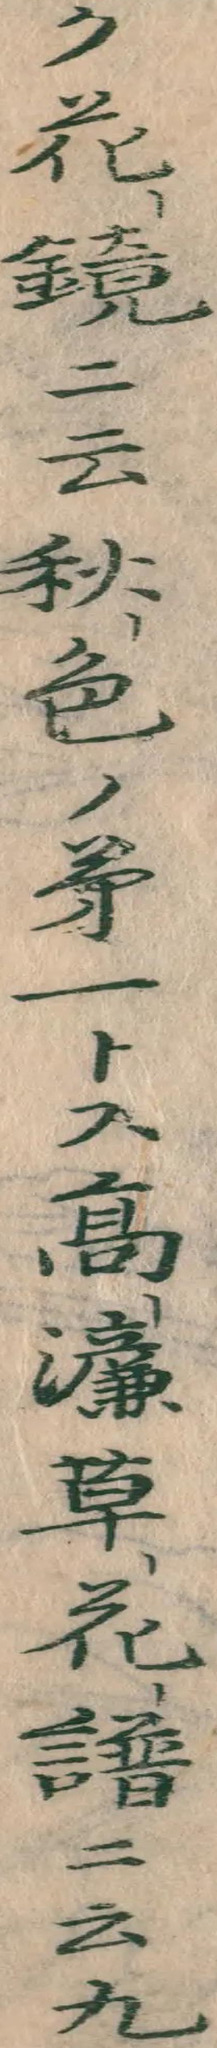ク花-鏡ニ云秋-色ノ第一トス高-濂草-花-譜ニ云九
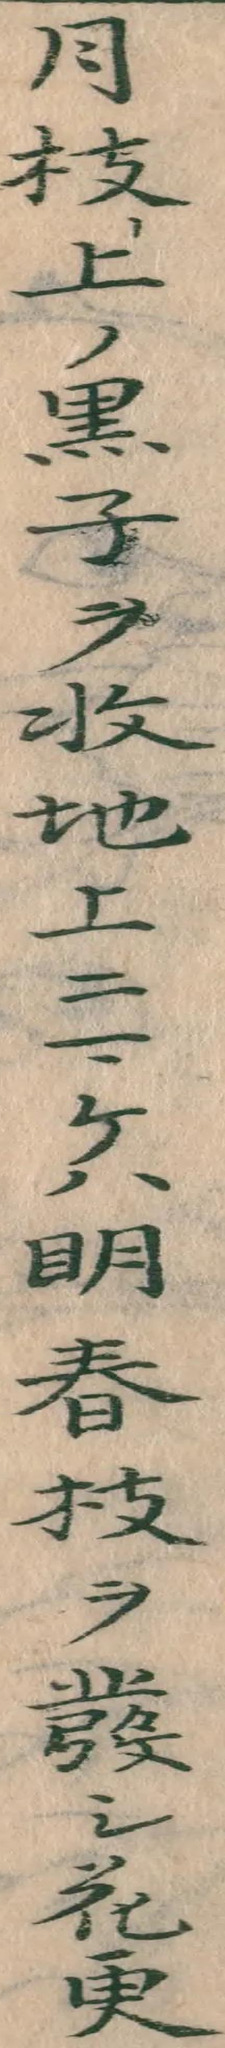月枝-上ノ黒子ヲ地上ニマケハ明春枝ヲ発シ花更
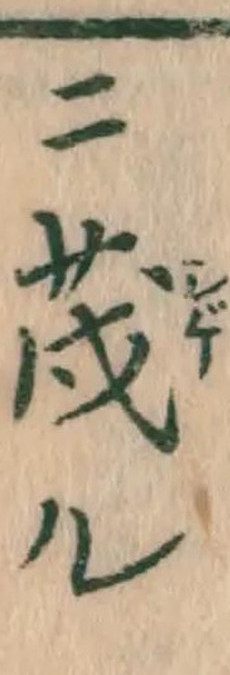ニ茂ル

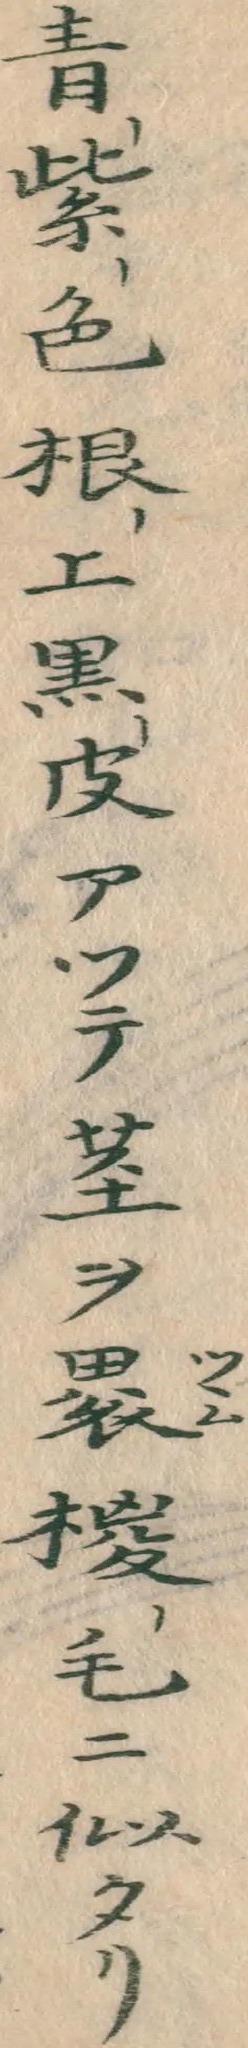青-紫-色根-上黒-皮アツテ茎ヲ棕-毛ニ似タリ
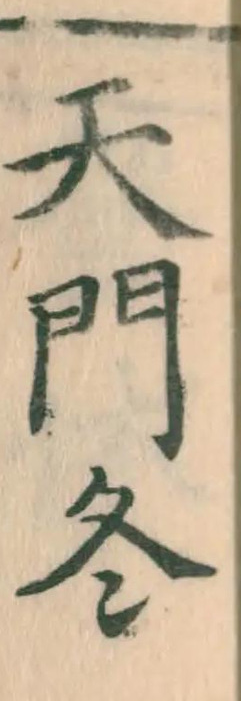天門冬

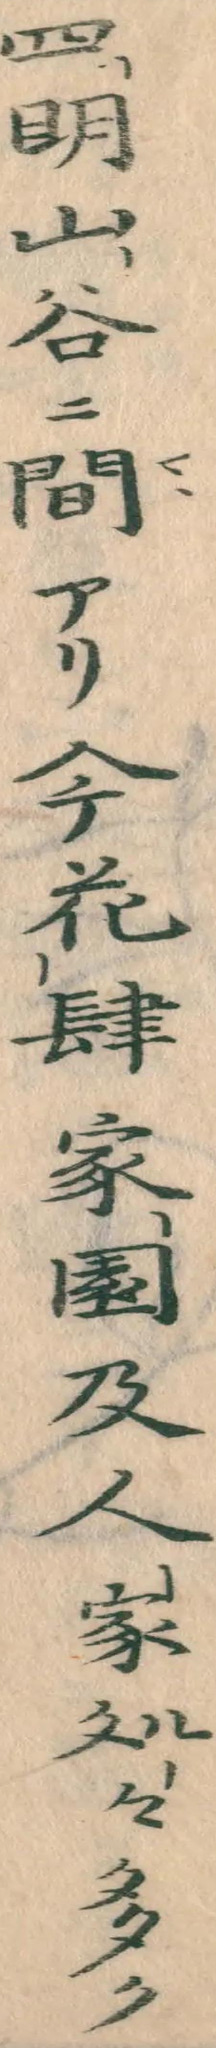四-明山-谷ニ間アリ今花-肆家-園及人-家処-々多ク
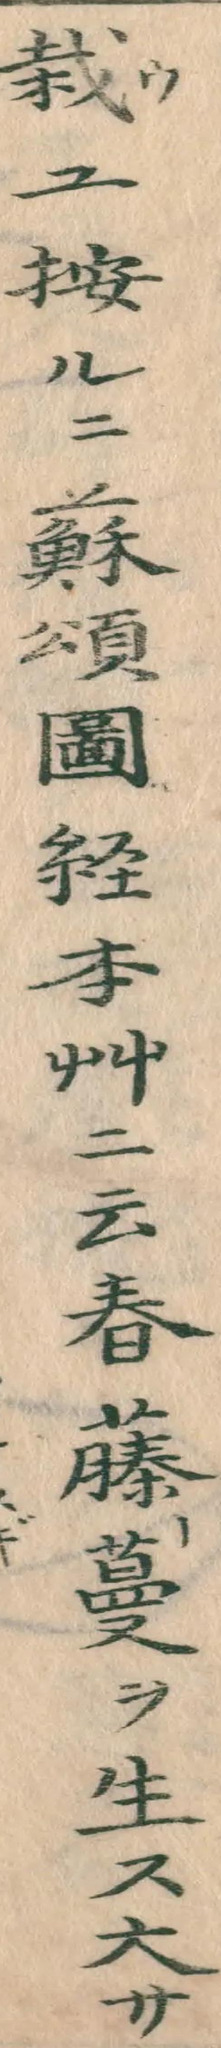栽ユ按ルニ蘇頌図経本艸ニ云春藤-蔓ヲ生ス大サ
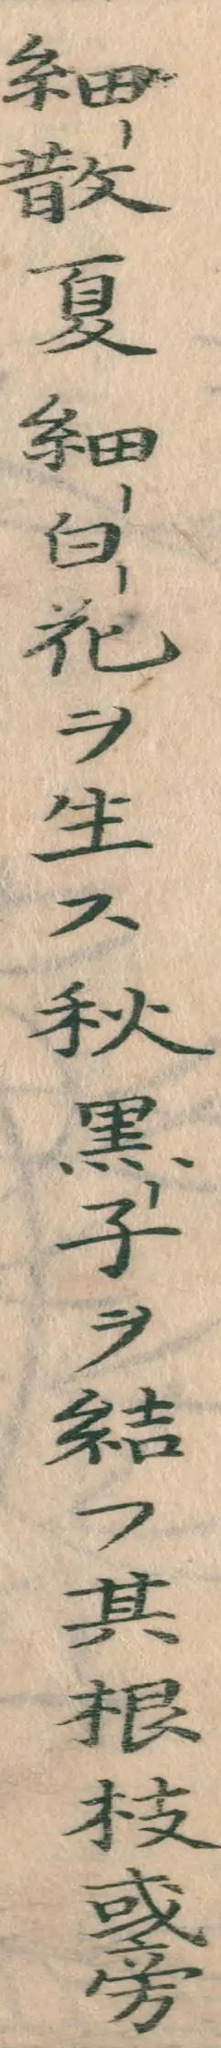細-散夏細-白-花ヲ生ス秋黒-子ヲ結フ其根枝或旁
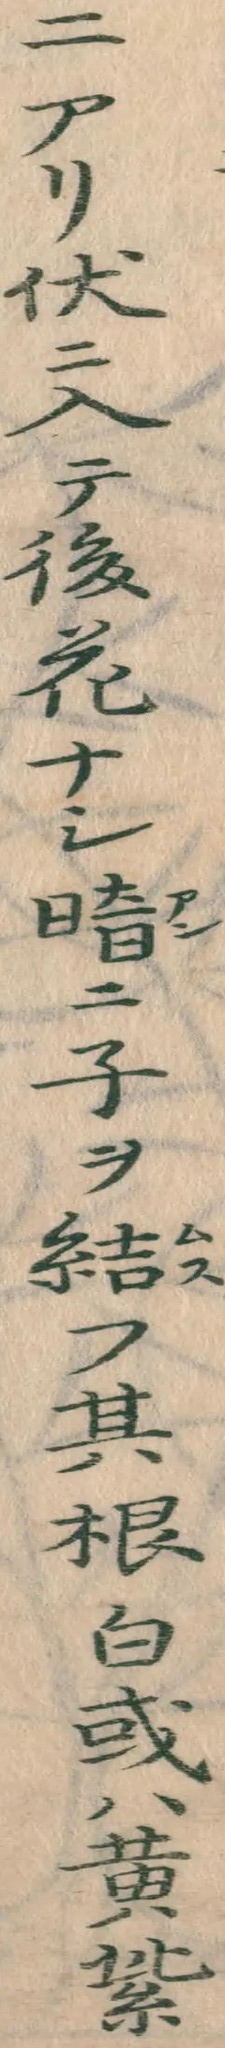ニアリ伏ニ入テ後花ナシ暗ニ子ヲ結フ其根白或ハ黄紫
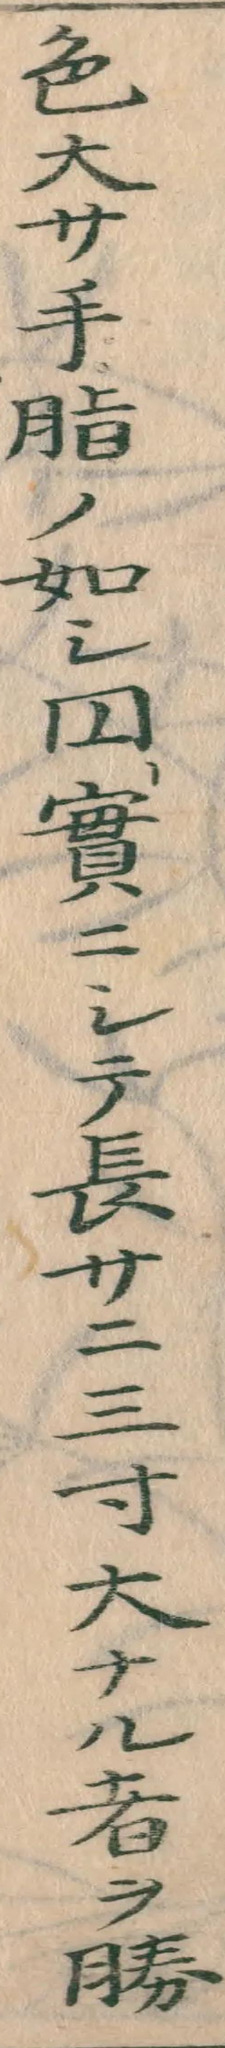色大サ手脂ノ如シ円-実ニシテ長サ二三寸大ナル者ヲ勝

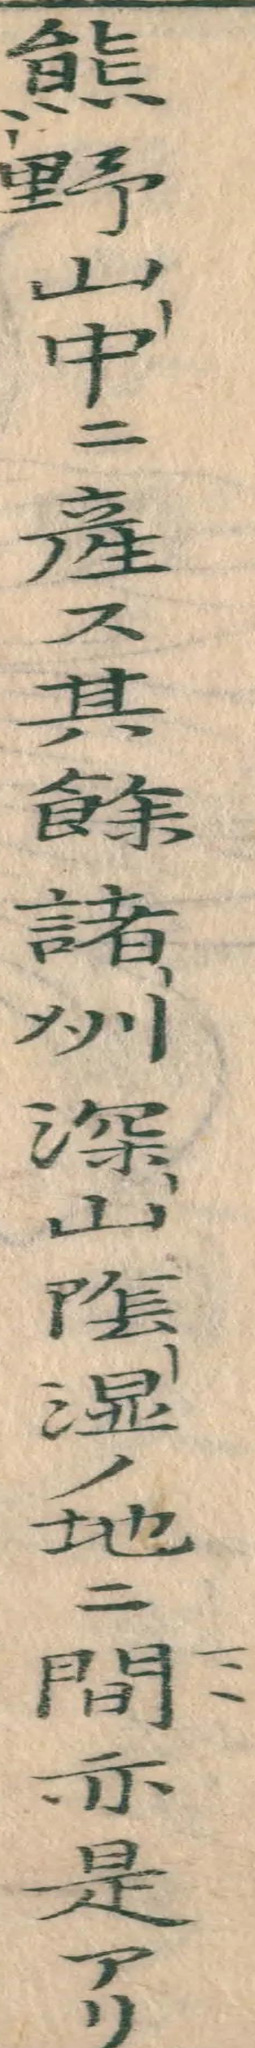熊-野山-中ニ産ス其余諸-州深-山陰-湿ノ地ニ間亦是アリ
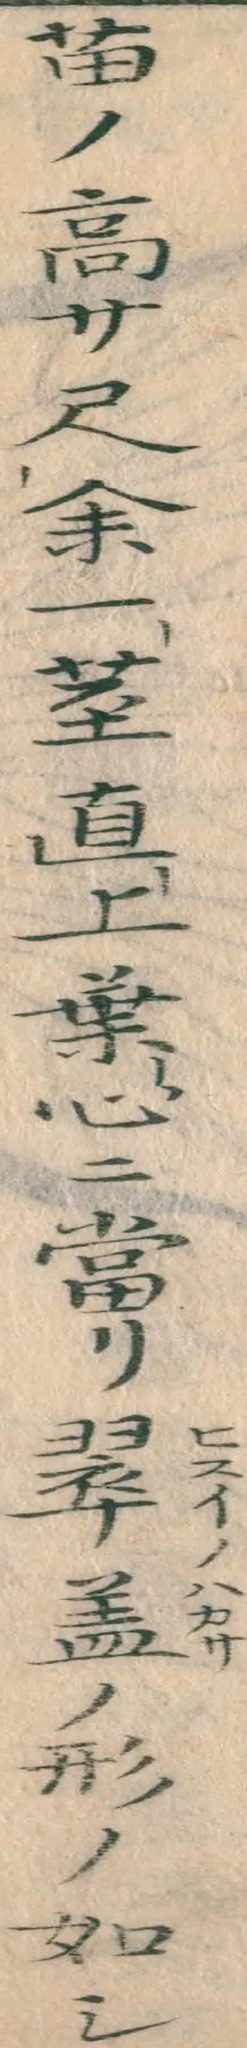苗ノ高サ尺-余一-茎直-上葉-心ニ当リ翠蓋ノ形ノ如シ
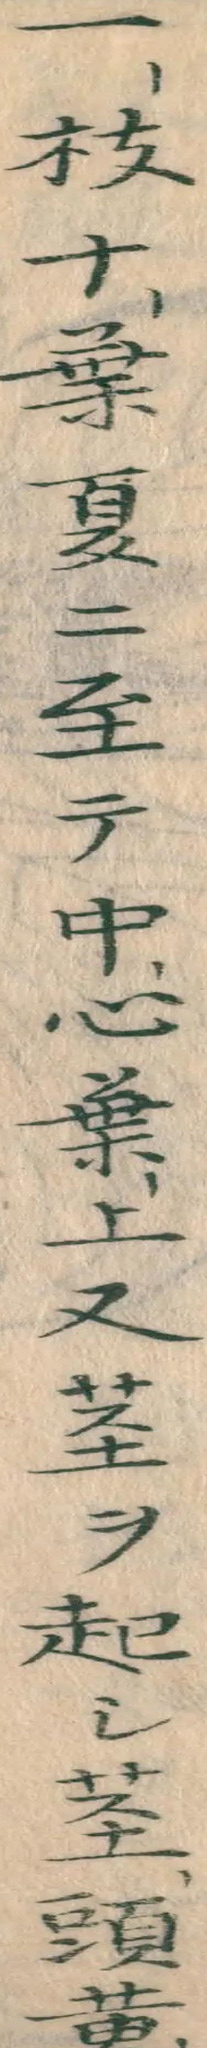一-枝十-葉夏ニ至テ中-心葉-上又茎ヲ起シ茎-頭黄-
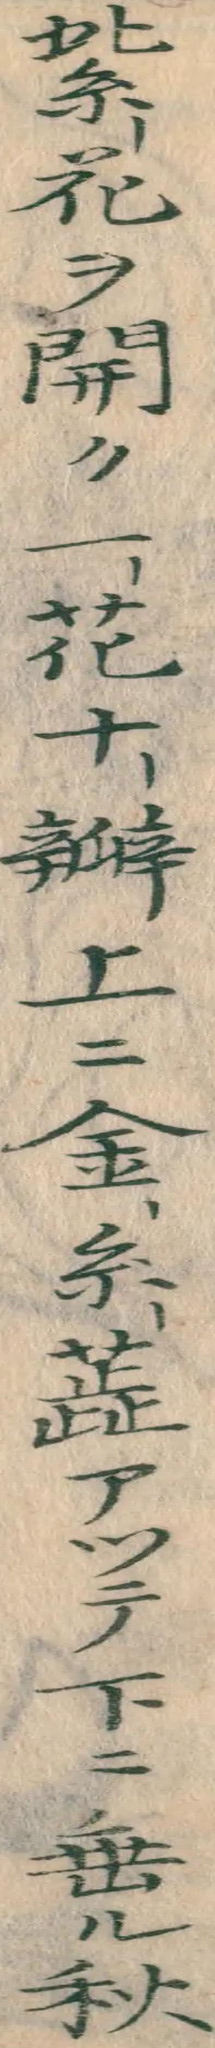紫-花ヲ開ク一-花十-弁上ニ金-糸-蕊アツテ下ニ垂ル秋
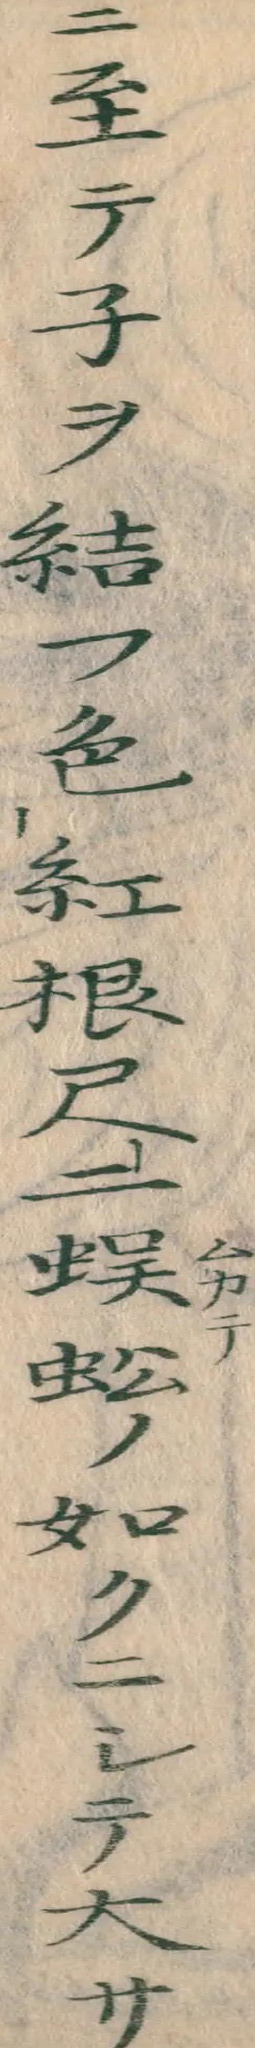ニ至テ子ヲ結フ色-紅根尺-二蜈蚣ノ如クニシテ大サ
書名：花彙 草部4巻木部4巻. [1]
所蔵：国立国会図書館 National Diet Library, JAPAN
